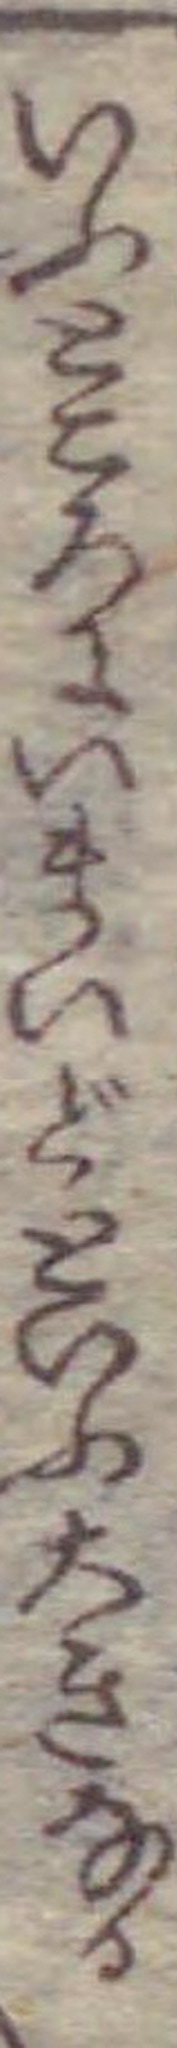いふところにいまいどといふ大きなる
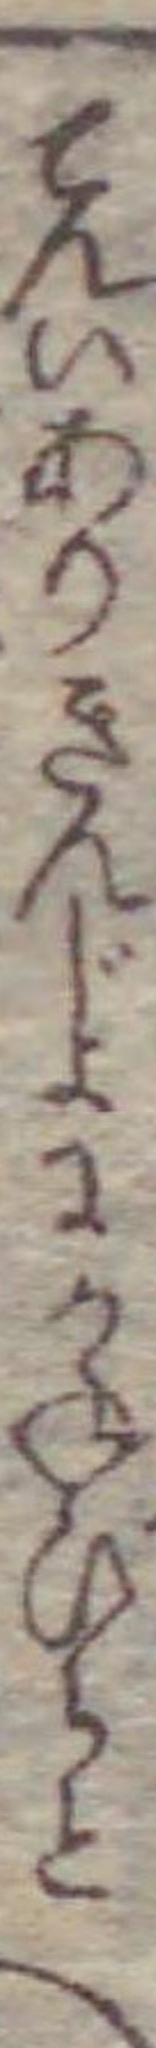てんいありきんじよにかねひらと
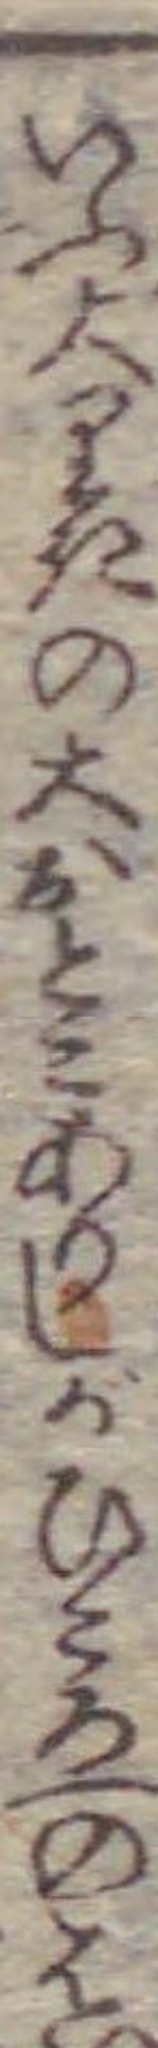いふ大りきの大おとこありしがひころのはい
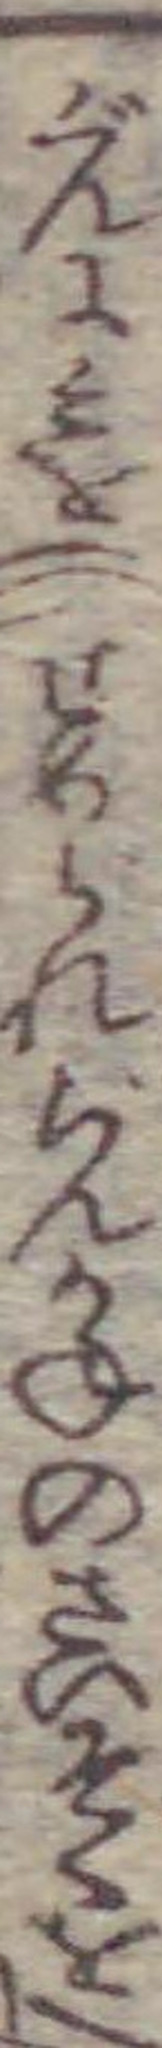ぐんにみをせめられぢんかねのさいそくを
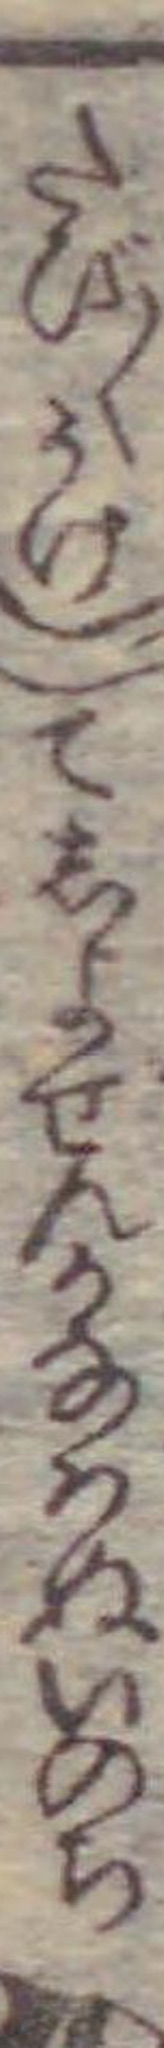たび〳〵うけてしよせんかなはぬいのち
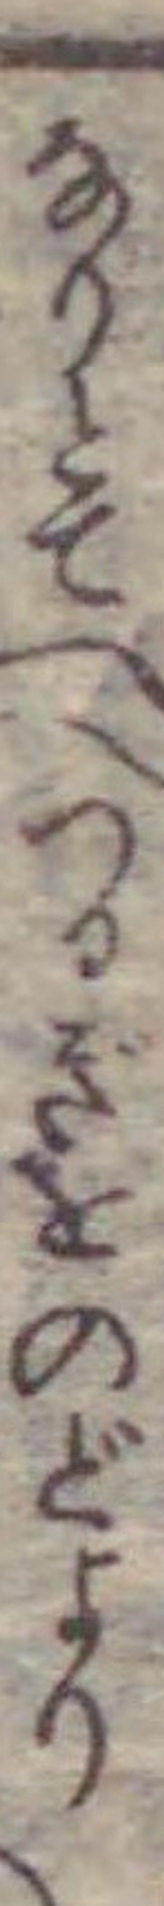なりとてつるぎをのどより
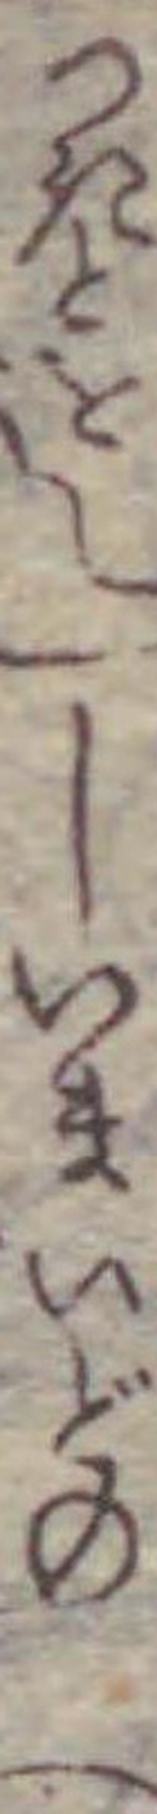つきとをしいまいどの
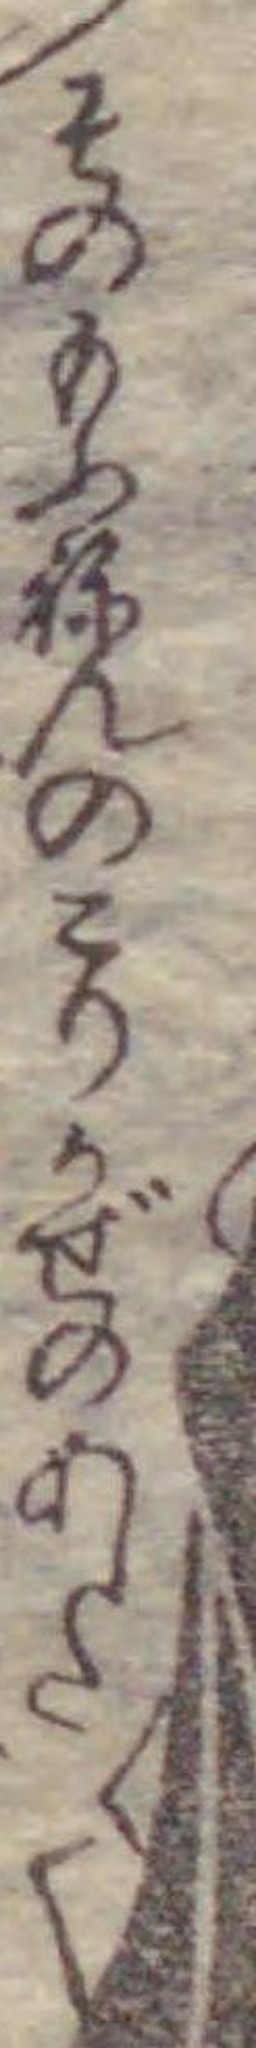そのもふねんのこりかぜのあした
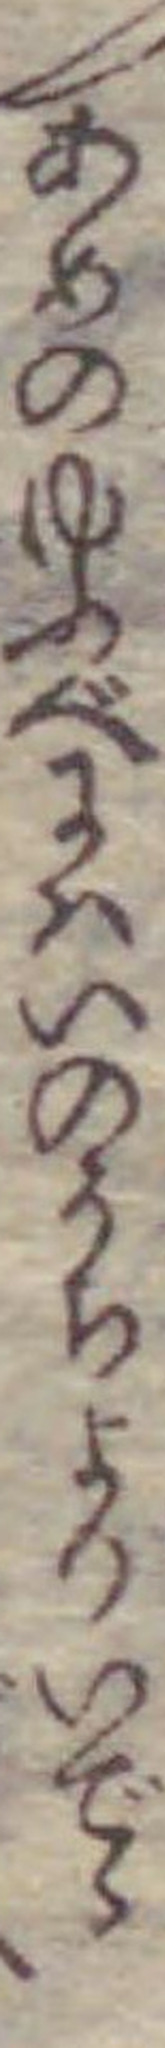あめのゆふべにはいのうちよりいでゝ
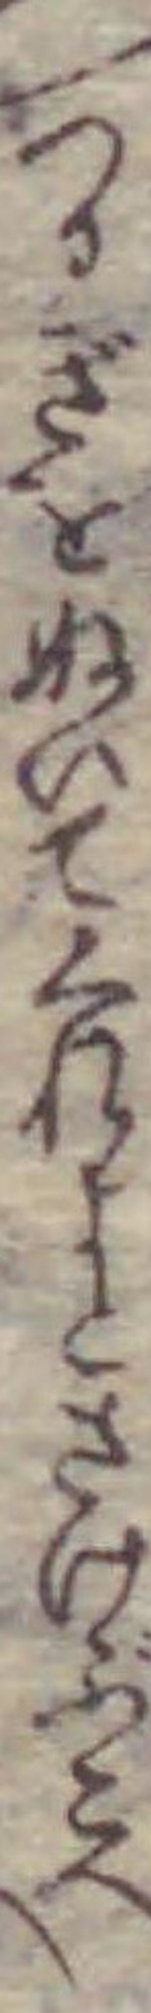つるぎをぬいてくれよとさけぶこへ
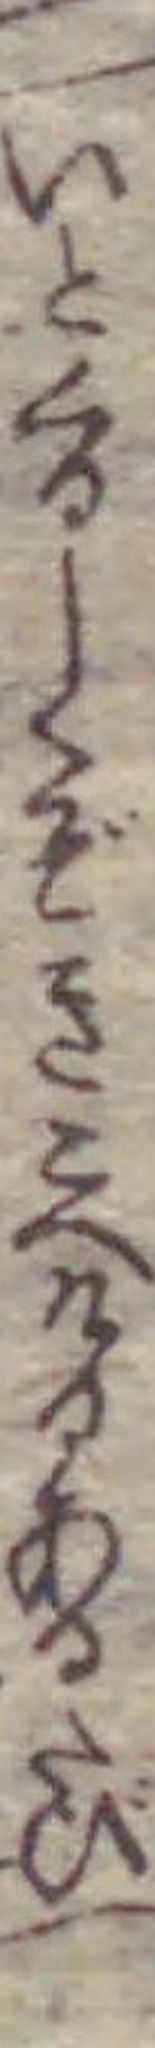いとくるしくぞきこへけるあるたび
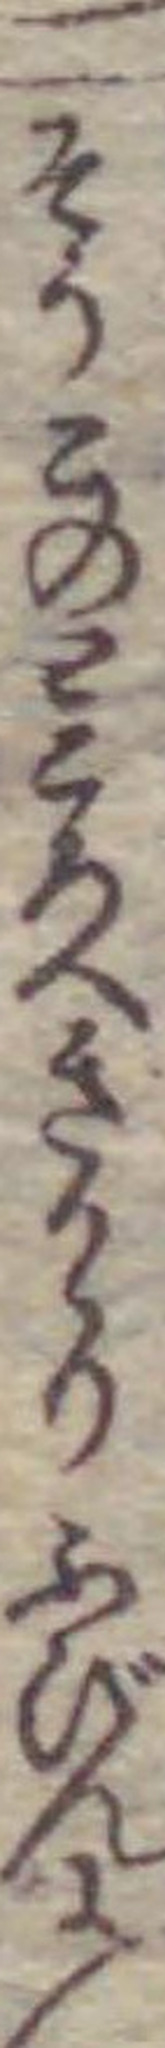そうこのところへきかゝりふびんに
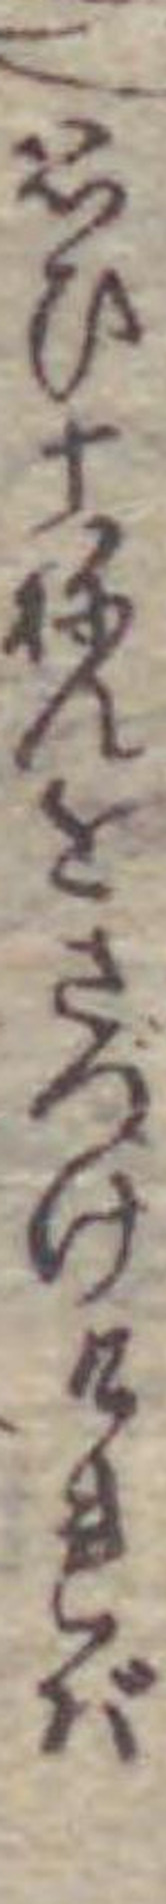思ひ十ねんをさづけければ
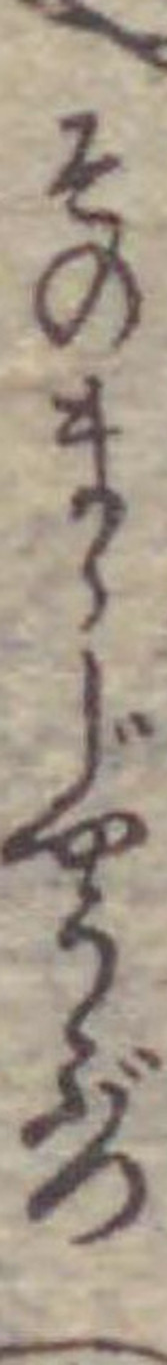そのまゝじやうぶつし
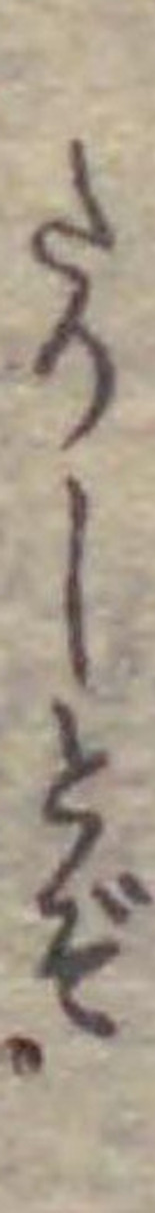たりしとぞ

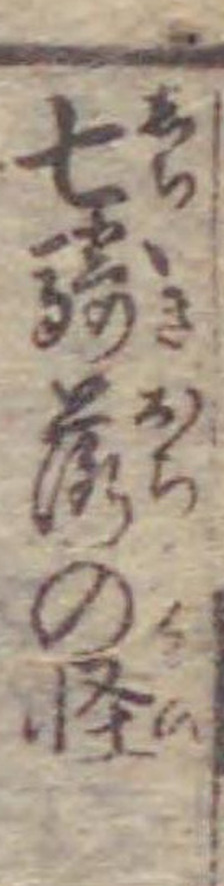七騎落の怪
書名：武家物奇談 : 3巻
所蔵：国立国会図書館 National Diet Library, JAPAN
